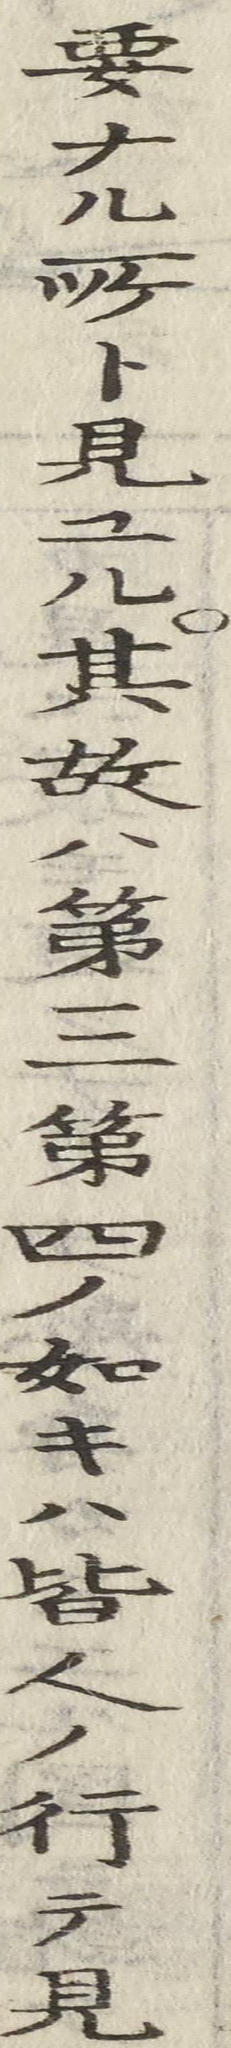要ナル所ト見ユル。其故ハ第三第四ノ如キハ皆人ノ行テ見
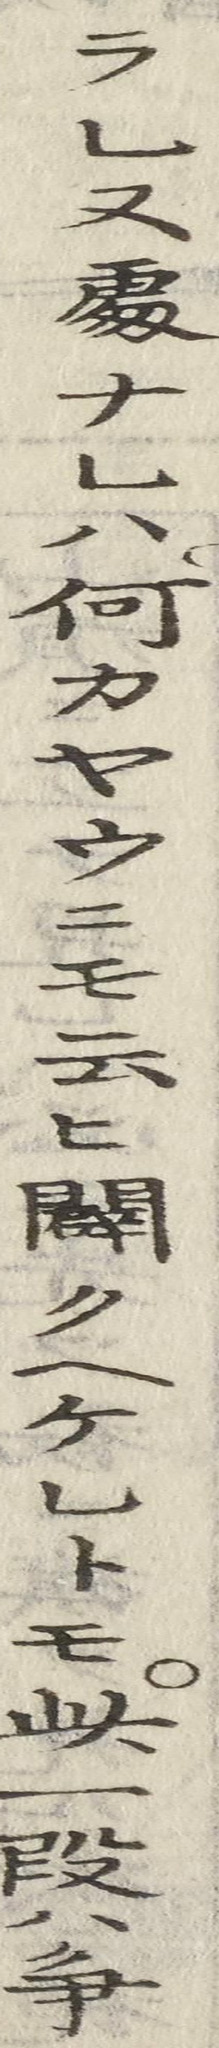ラレヌ処ナレハ。何カヤウニモ云ヒ闢クヘケレトモ。此一段ハ争
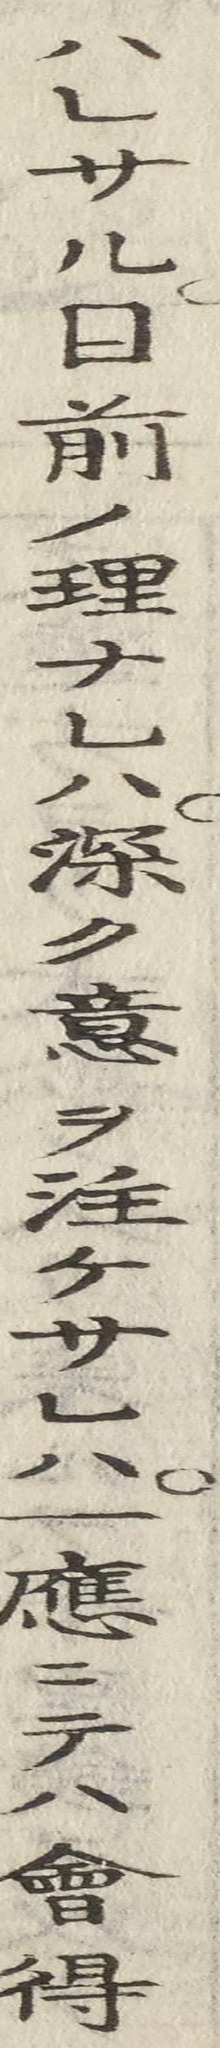ハレサル。日前ノ理ナレハ。深ク意ヲ注ケサレハ。一応ニテハ会得
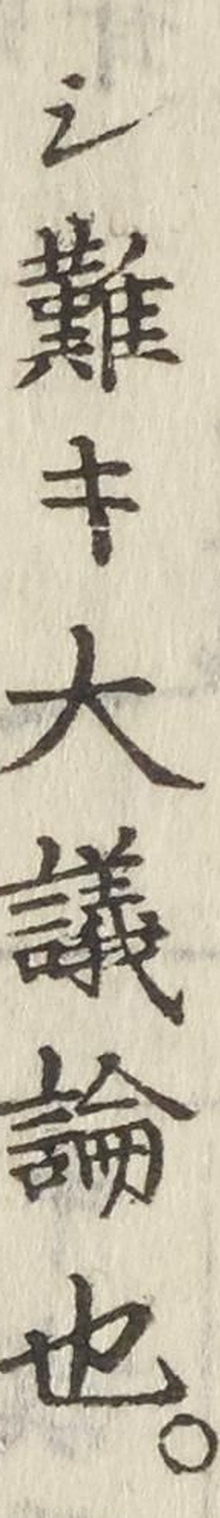シ難キ大議論也。
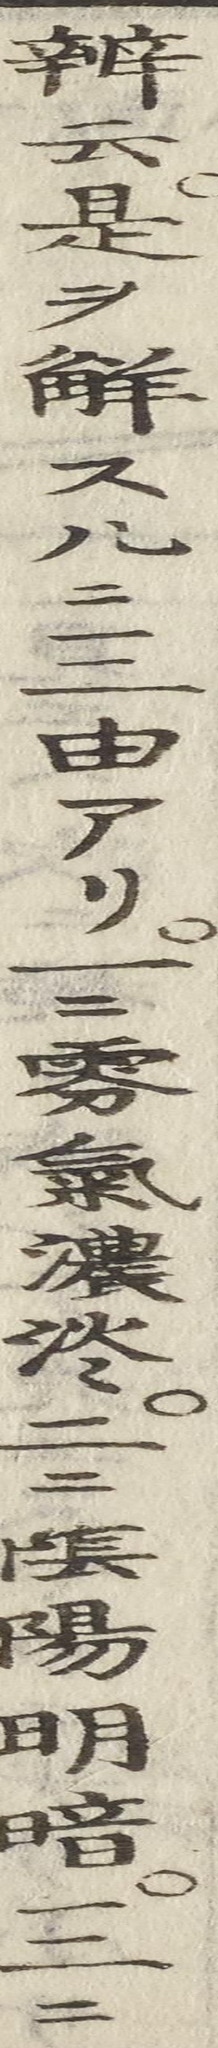弁云。是ヲ解スルニ三由アリ。一ニ雰気濃淡。二ニ陰陽明暗。三ニ
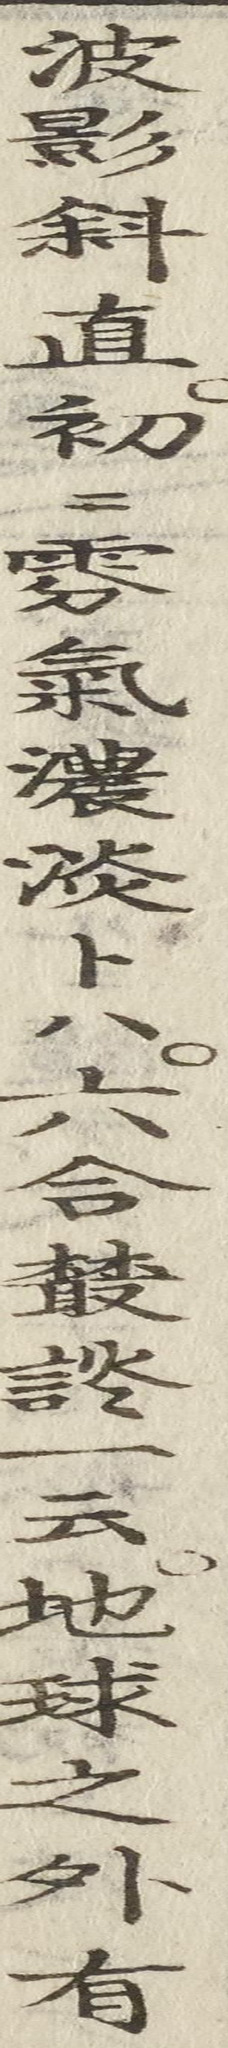波影斜直。初ニ雰気濃淡トハ。六合樷談一云。地球之外有
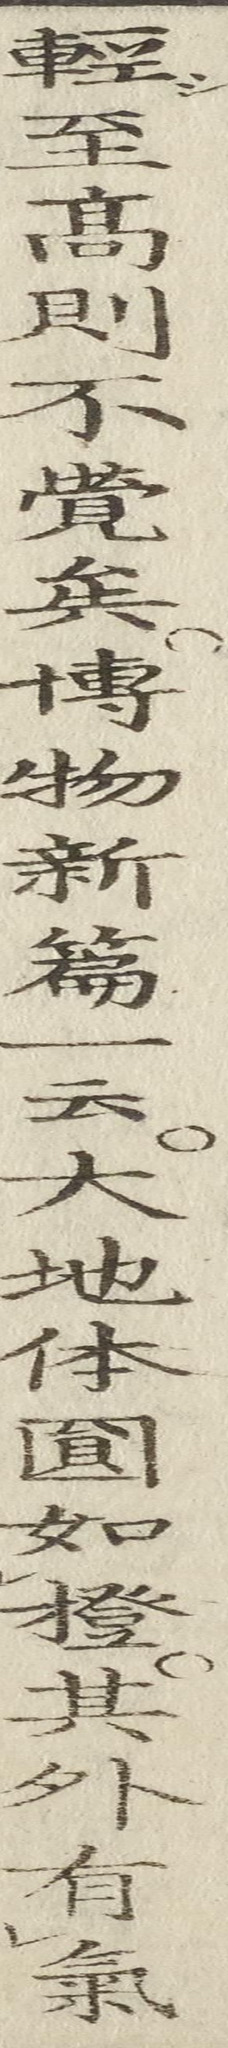軽至高則不覚矣。博物新篇一云。大地体円如橙。其外有気
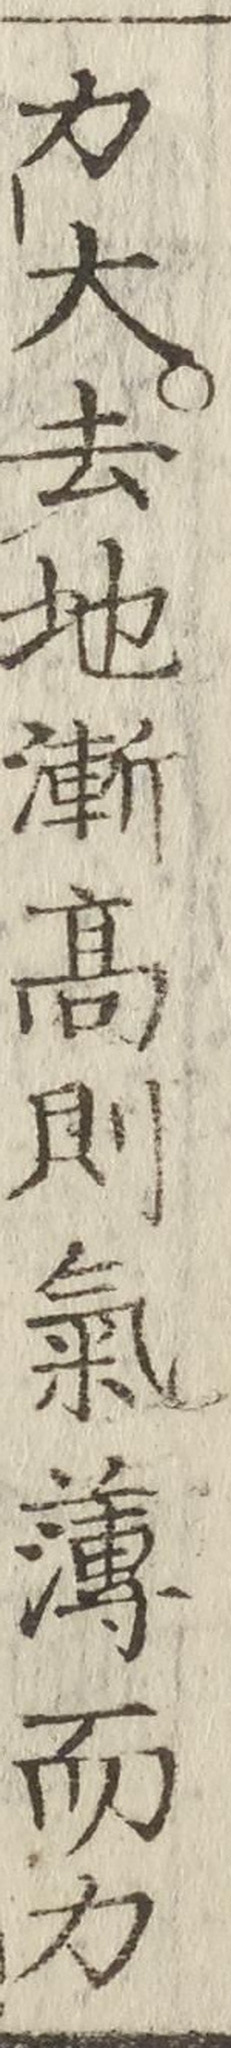カ－大。去地漸髙則気薄而カ－
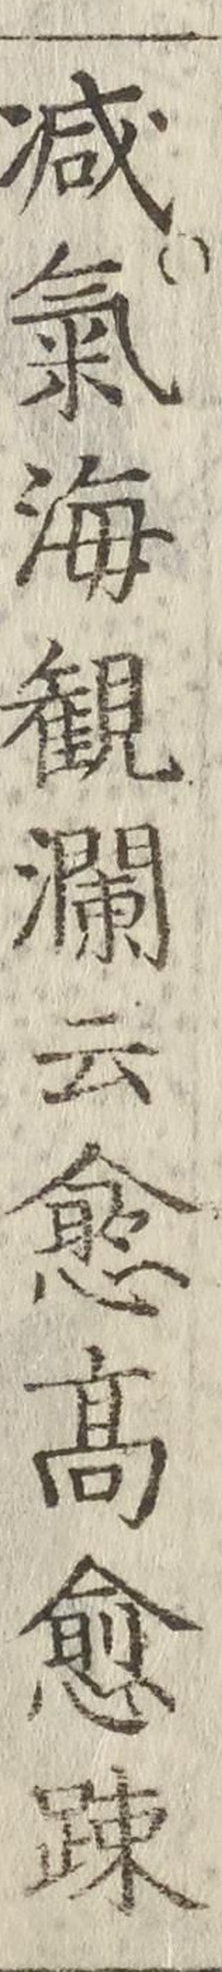減。気海観瀾云愈高愈疎
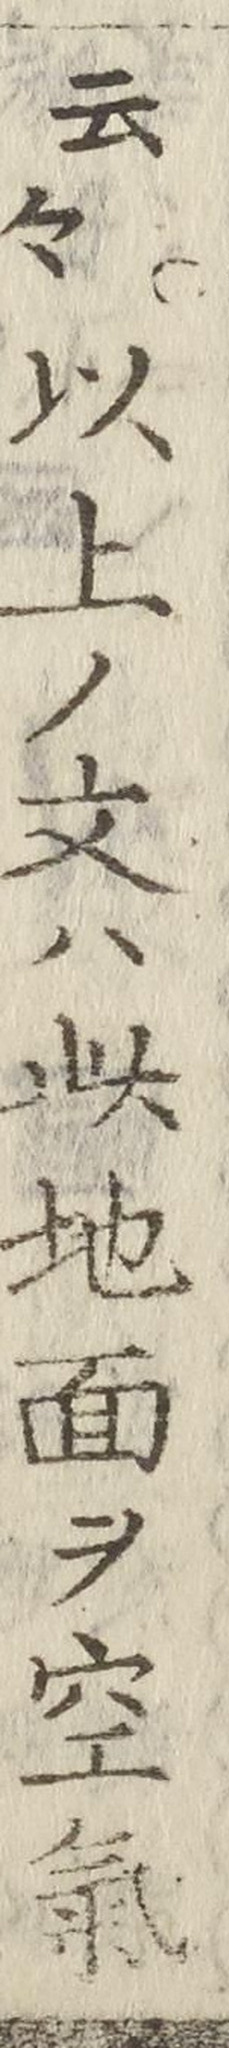云々。以上ノ文ハ此地面ヲ空気
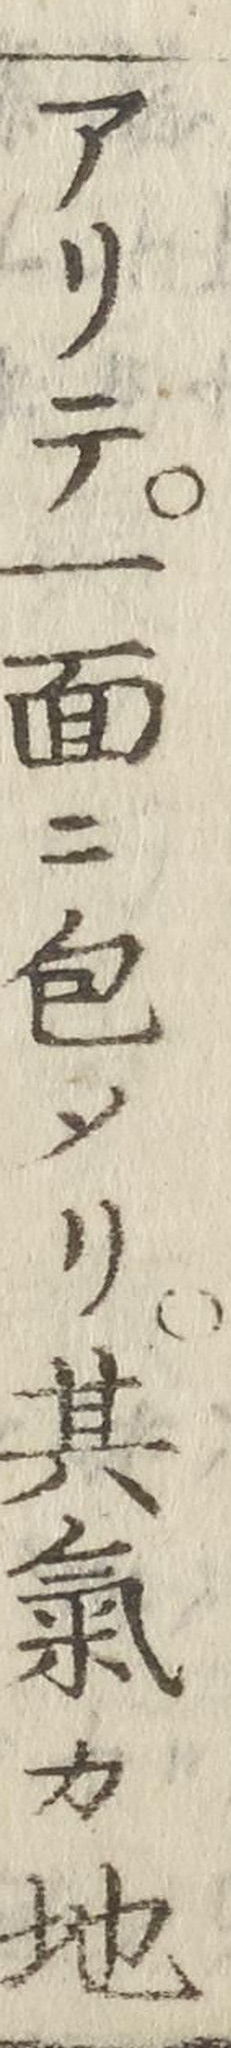アリテ。一面ニ包タリ。其気カ地
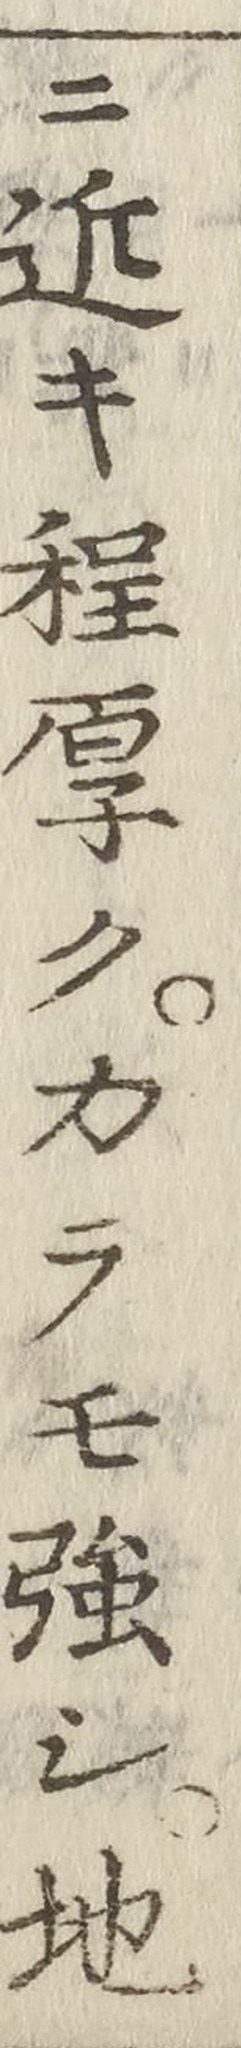ニ近キ程厚ク。カラモ強シ。地
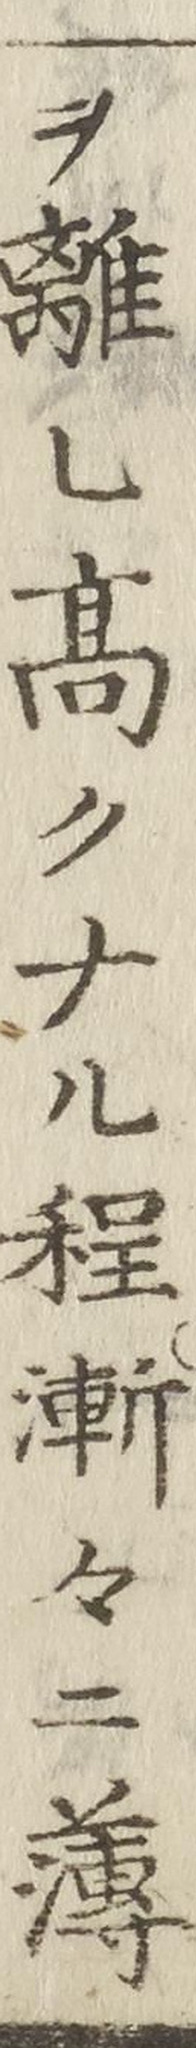ヲ離レ高クナル程。漸々ニ薄
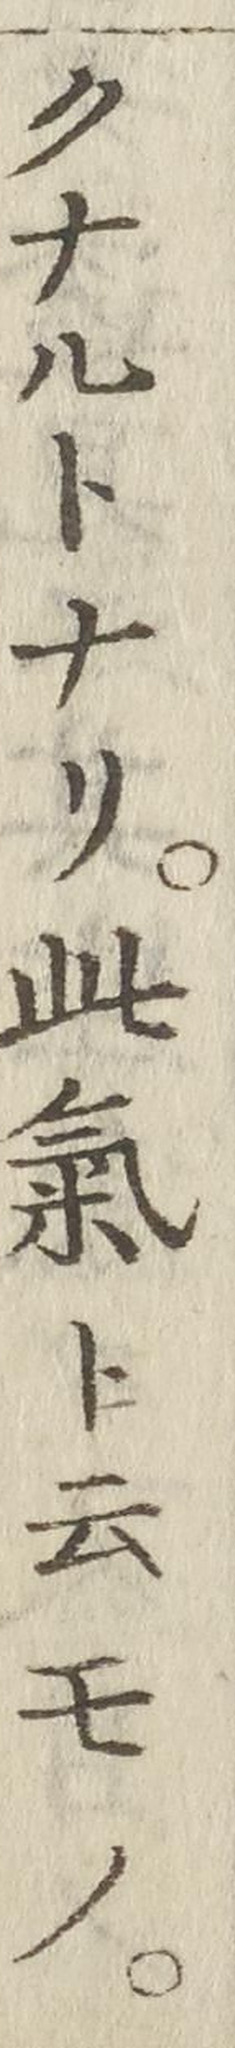クナルトナリ。此気ト云モノ。

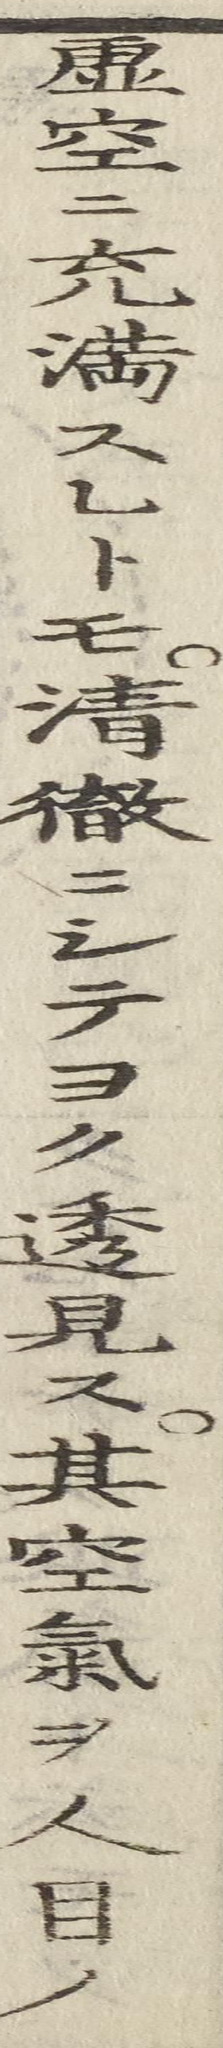虚空ニ充満スレトモ。清徹ニシテヨク透見ス。其空気ヲ人目ノ
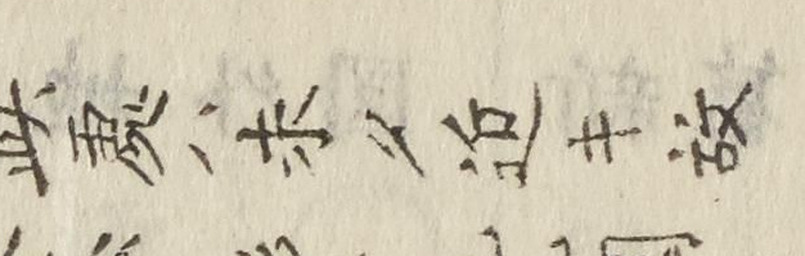此処ハ未タ近キ故
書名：護法新論　中
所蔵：東京大学地震研究所図書室 Earthquake Research Institute Library, The University of Tokyo, JAPAN
